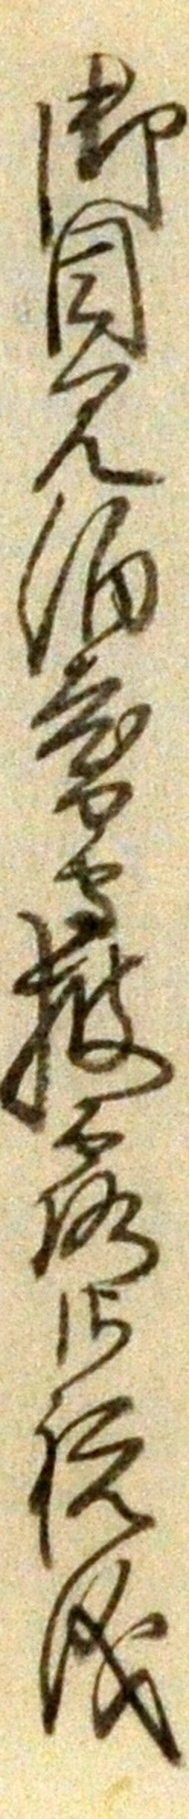御目見伯耆守披露御祝儀
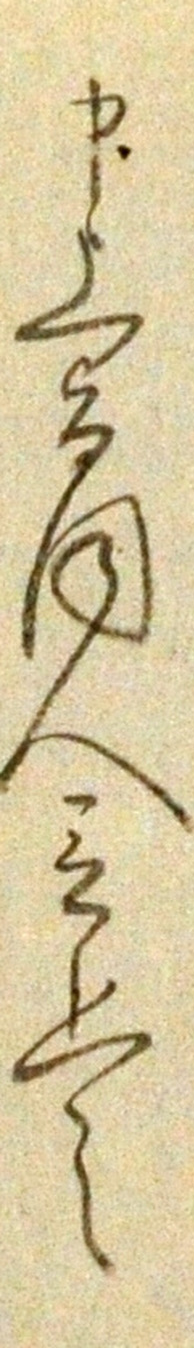申上旨同人言上之
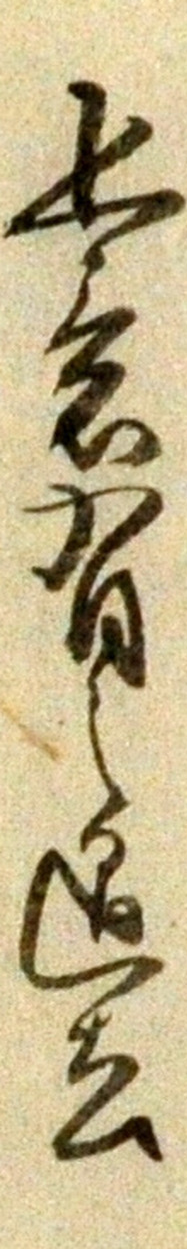上意有之退去
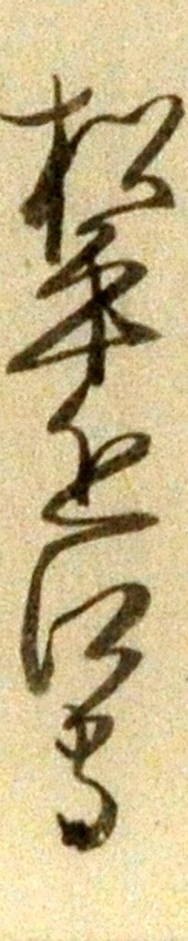松平近江守
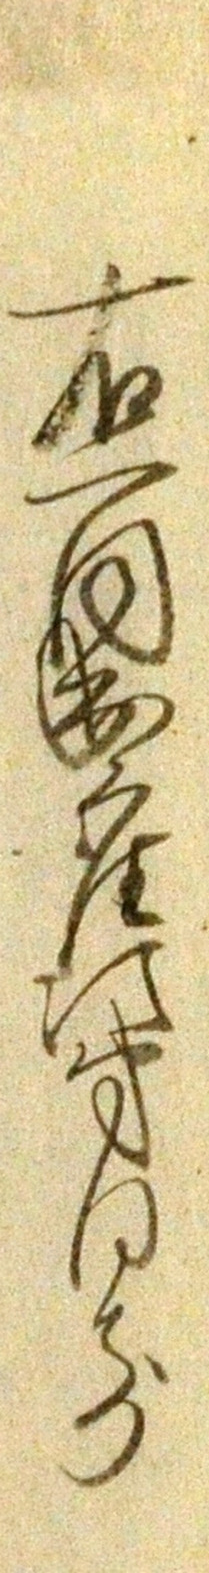右一同出座次第同前
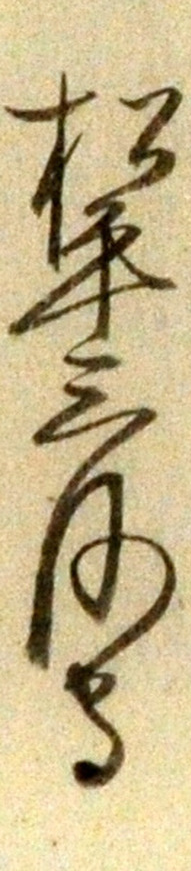松平三河守
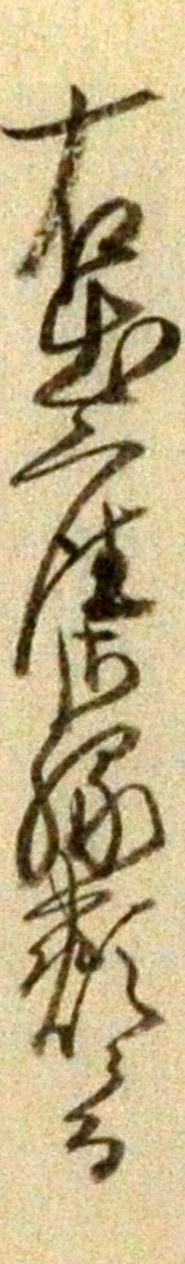右出座御縁頬ニ而
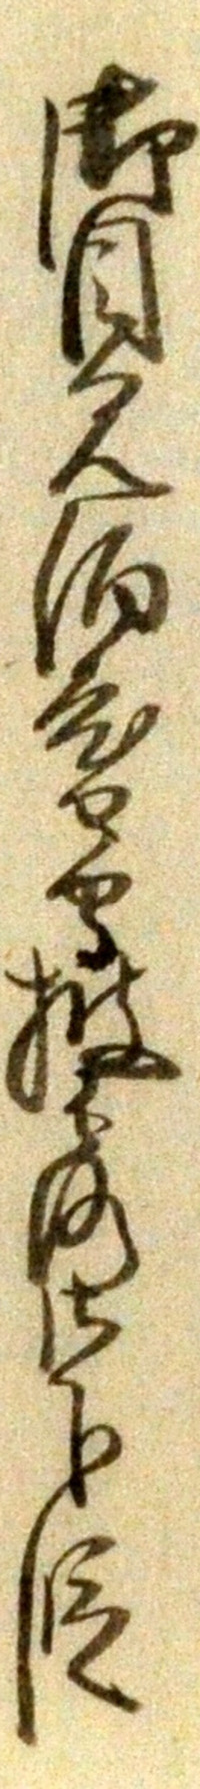御目見伯耆守披露御下段
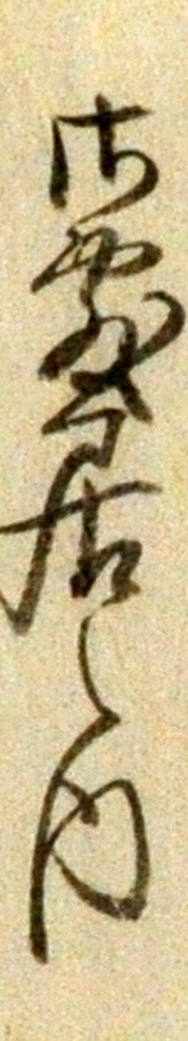御敷居之内
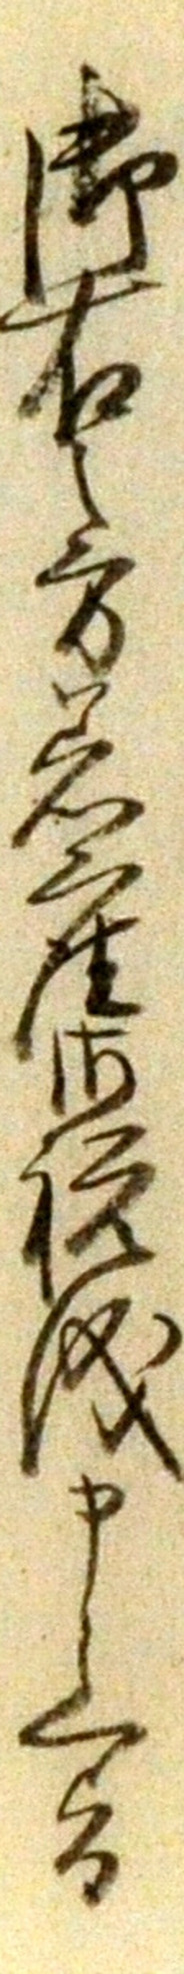御右之方着座御祝儀申上旨
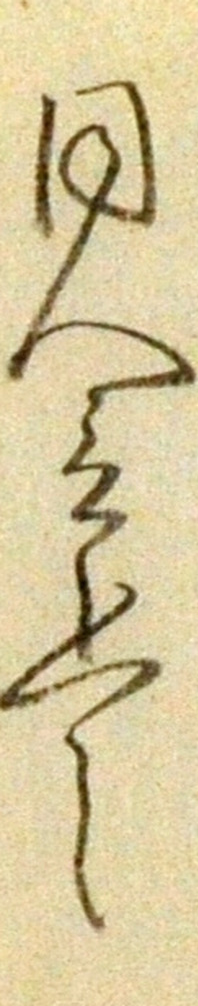同人言上之

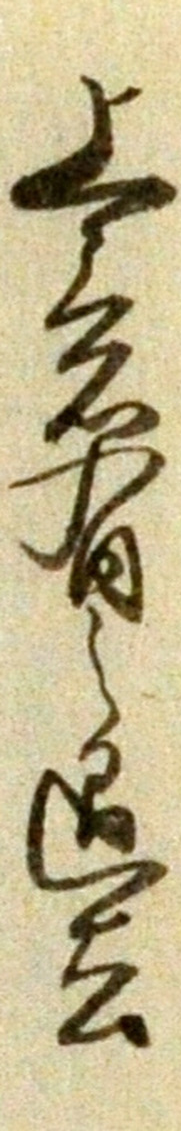上意有之退去
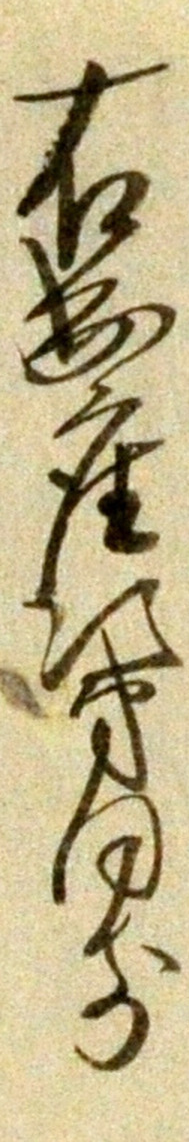右出座次第同前
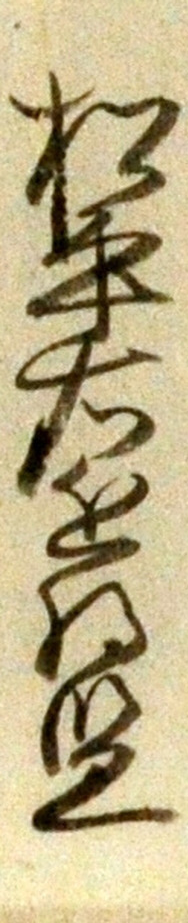松平右近将監
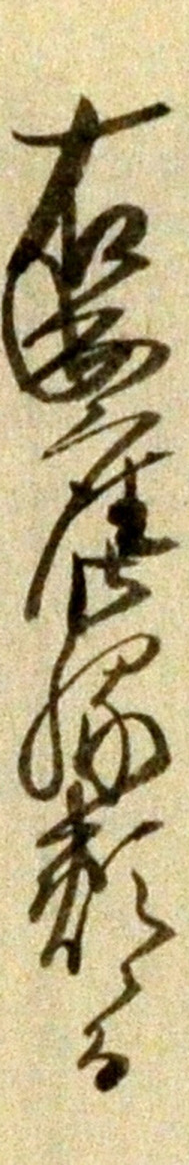右出座御縁頬ニ而
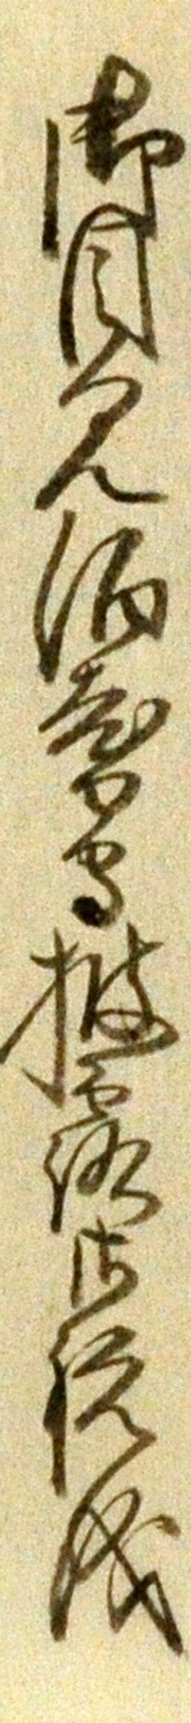御目見伯耆守披露御祝儀
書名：御馳走御能ノ節ノ留外
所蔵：伊那市立高遠町図書館・合同会社AMANE
